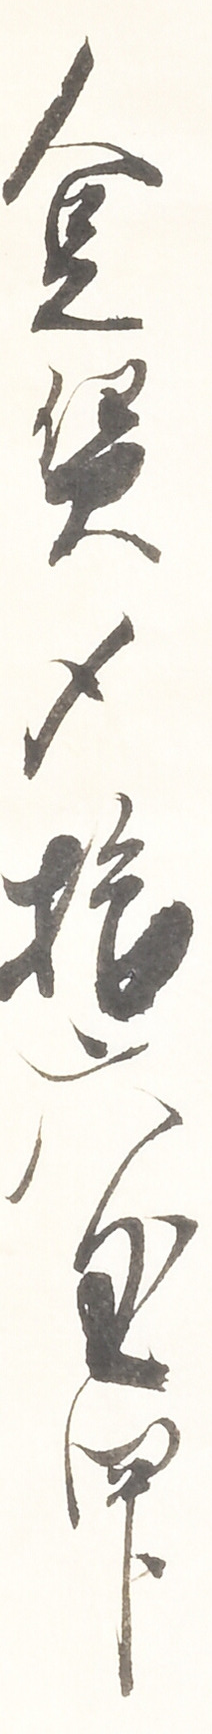人足賃〆拾六匁四分
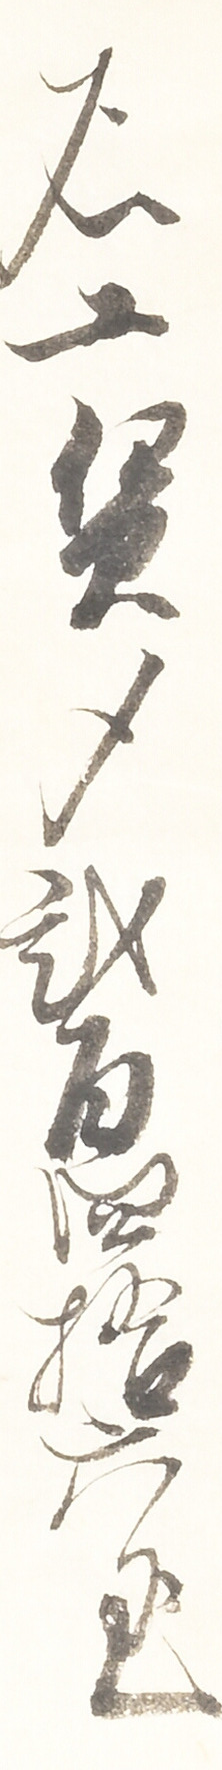石工賃〆弐百四拾六匁
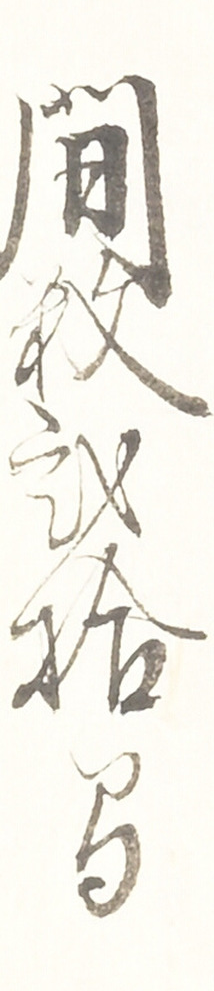間数弐拾間
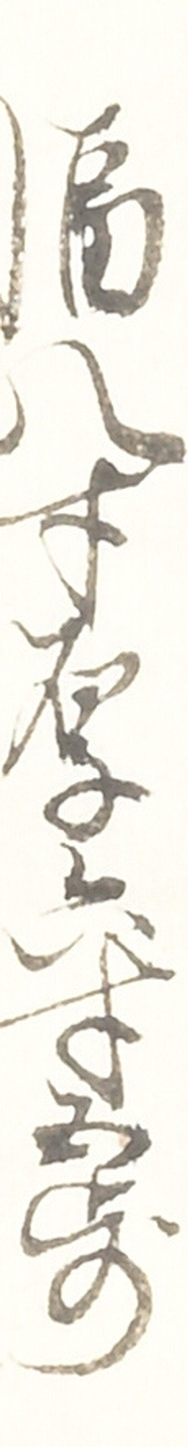幅八寸厚六寸五歩

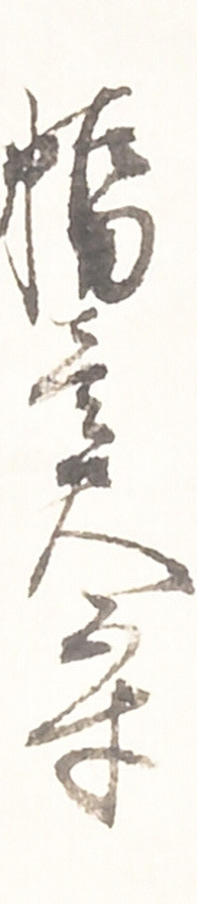幅壱尺五寸
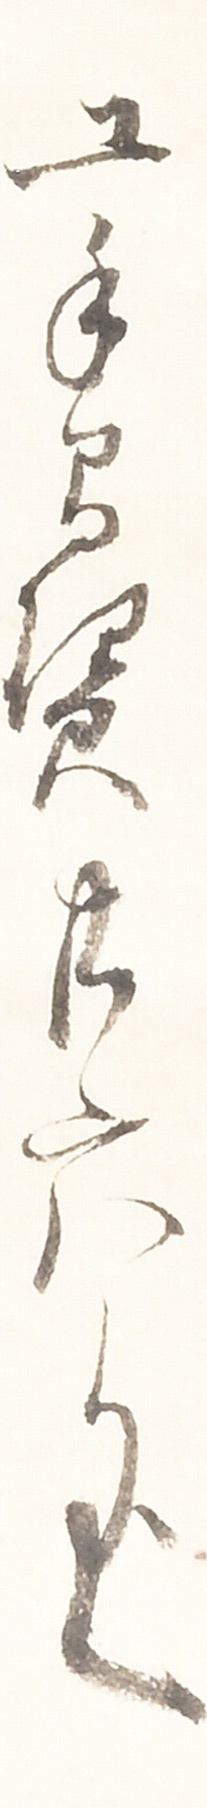工手間賃廿六匁
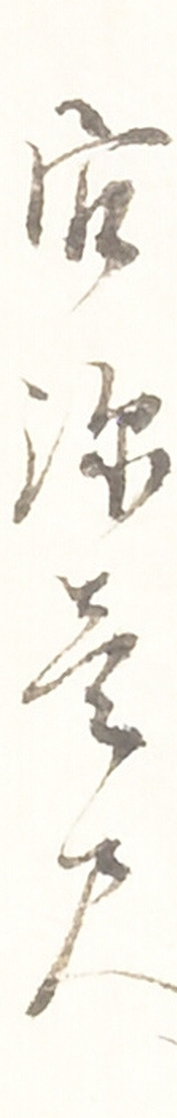穴深壱尺
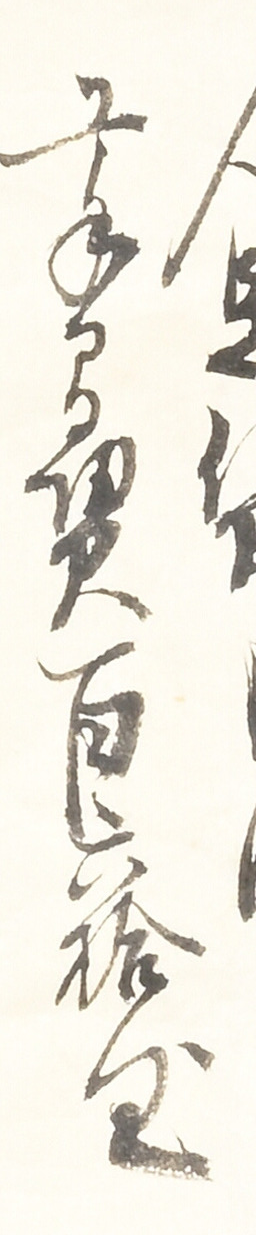工手間賃百六拾匁

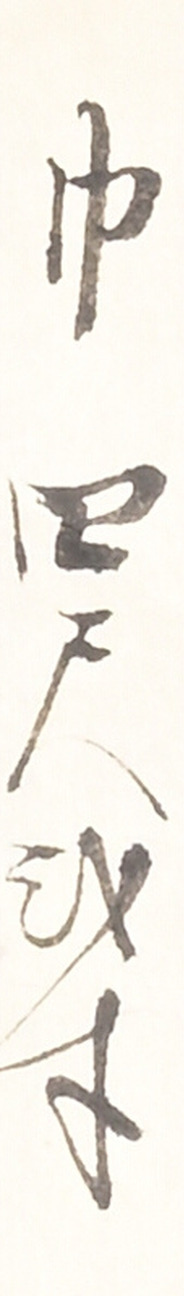幅四尺弐寸
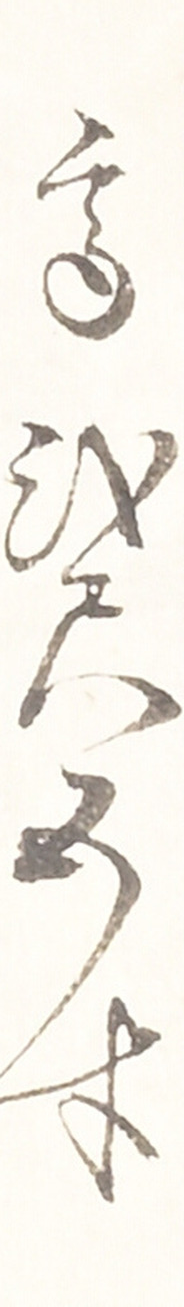高弐尺五寸
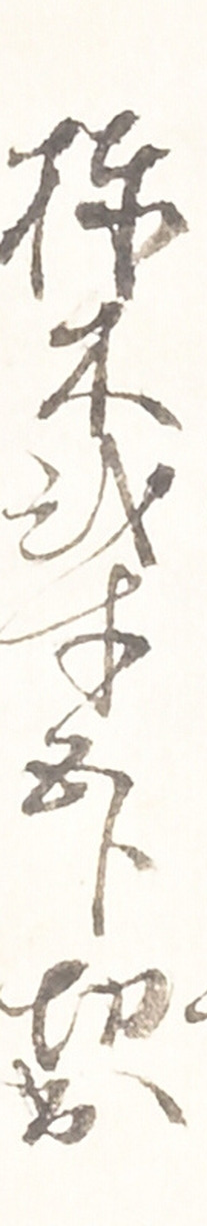棟木二寸五歩切出
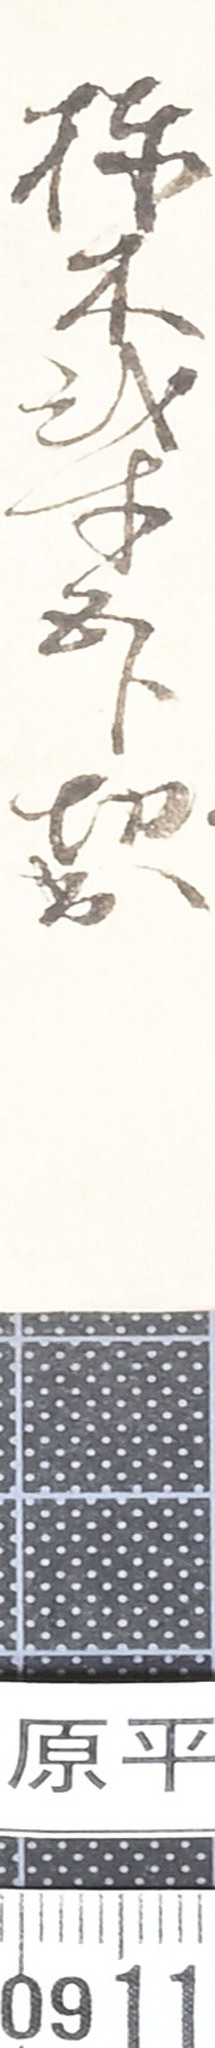棟木二寸五歩切出
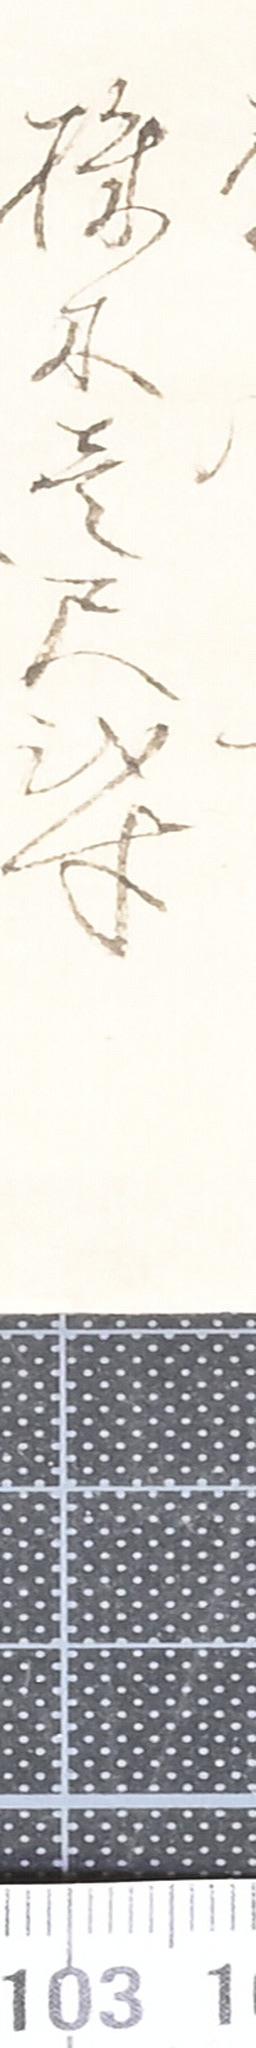棟木壱尺弐寸
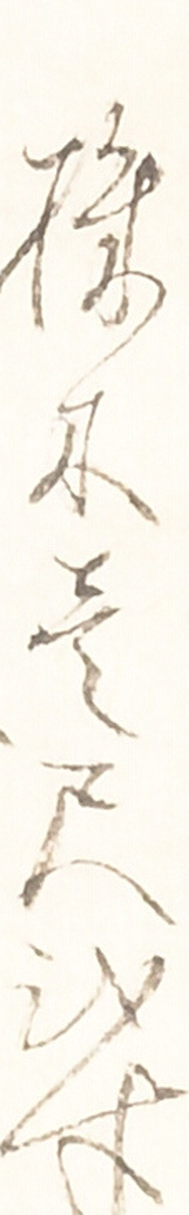棟木壱尺弐寸
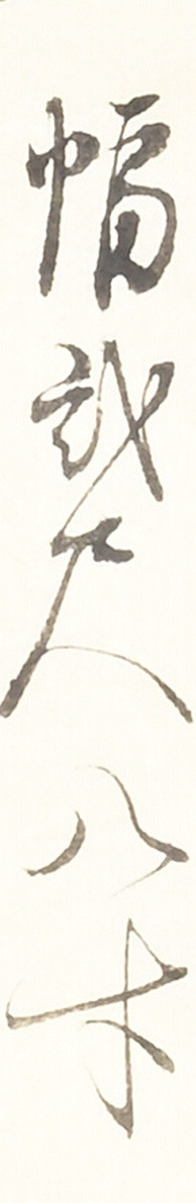幅弐尺八寸

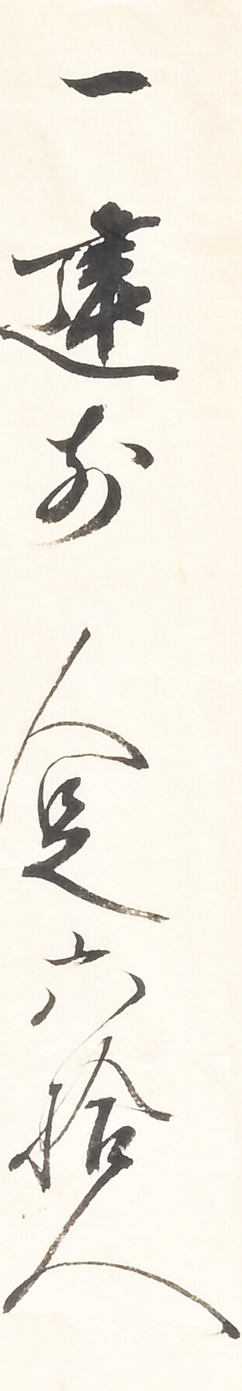一建前人足六拾人
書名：天保十亥年六月武田信玄様御玉垣仕様書上帳
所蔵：伊那市立高遠町図書館・合同会社AMANE
